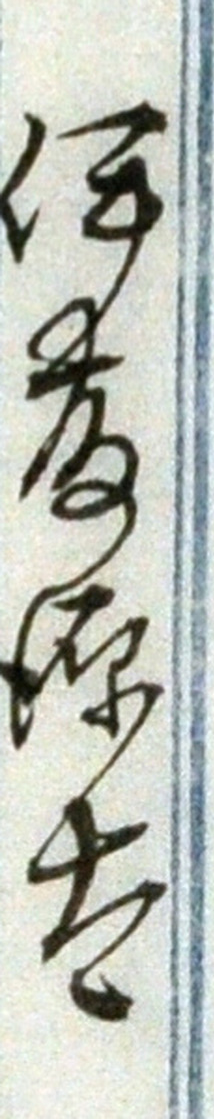伊藤源太
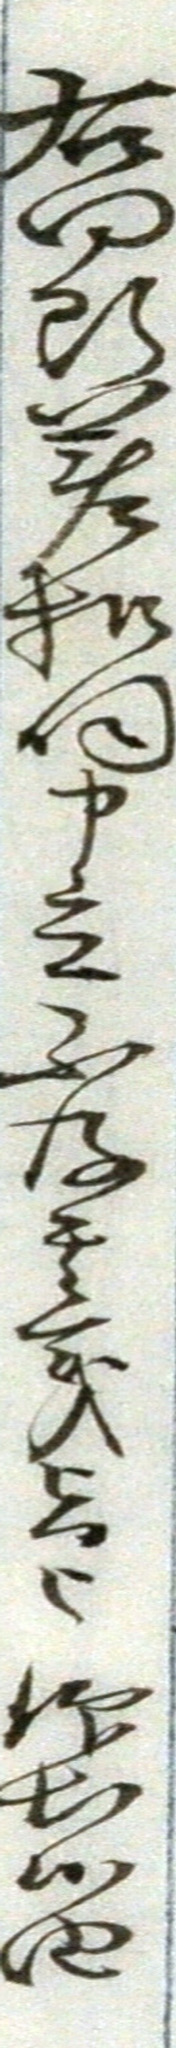右同断差扣伺申立不及其義旨被仰出候由
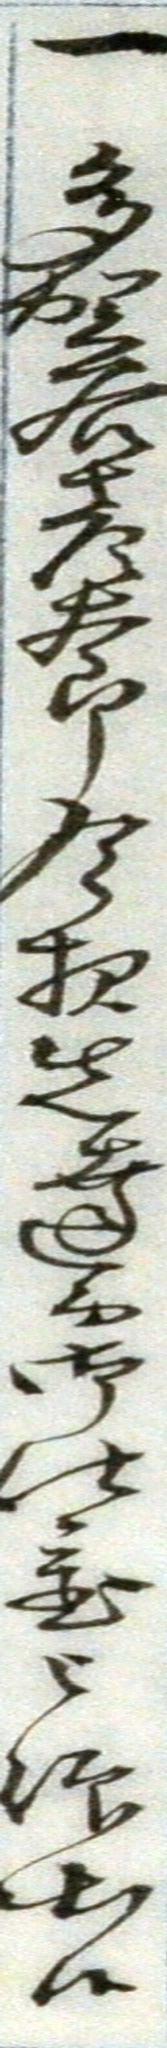一多賀谷彦太郎今夜先達而御仕置被仰出候
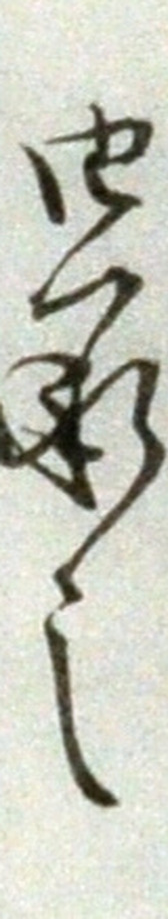由承之
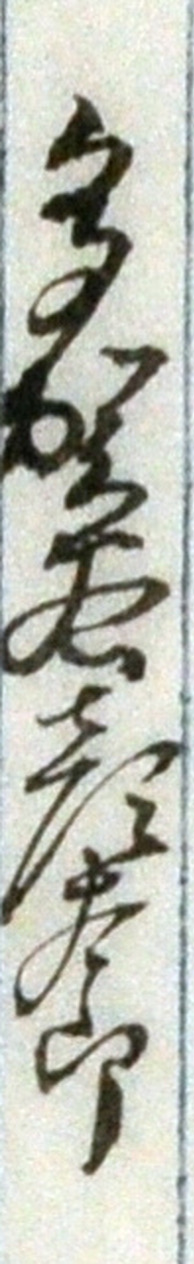多賀谷彦太郎
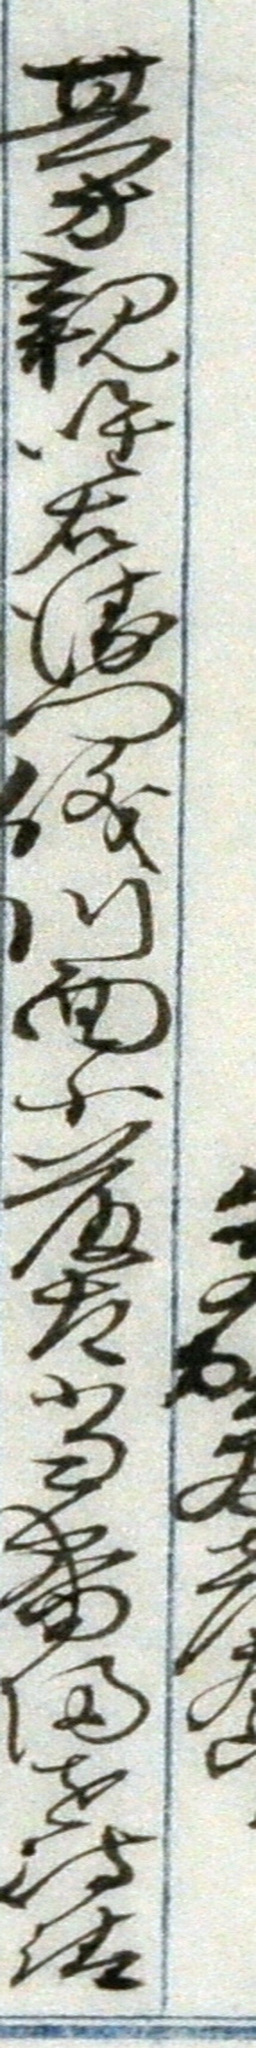其方親唯右衛門儀川面小藤太当番帰を待請
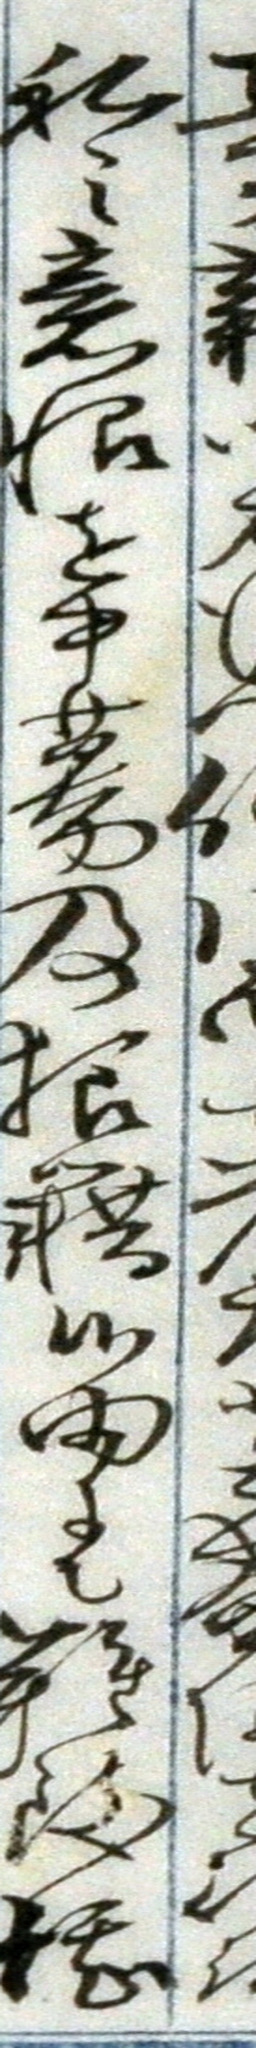私之意恨を申募及狼藉候由尓て難致堪
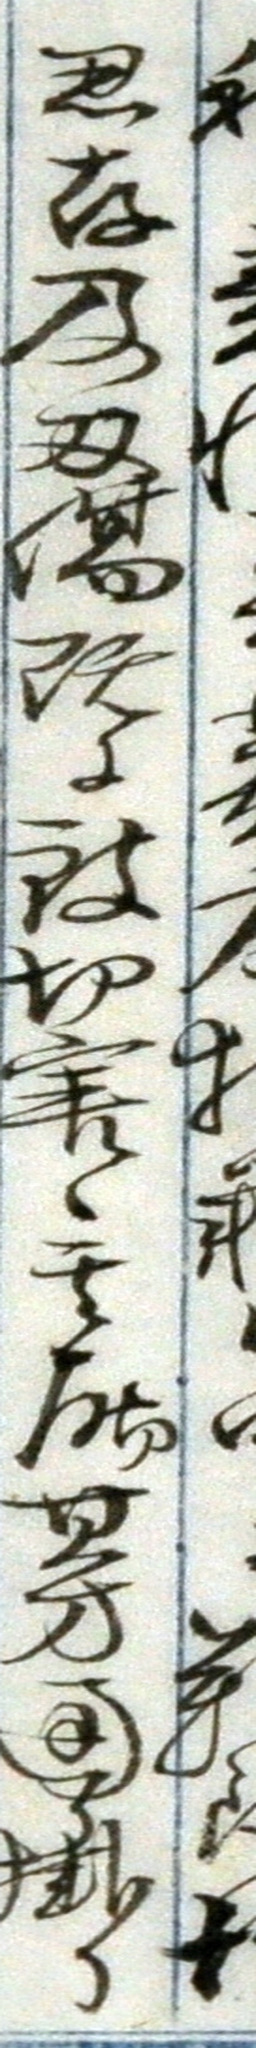忍存及刃傷既尓致切害候其砌其方通り掛り
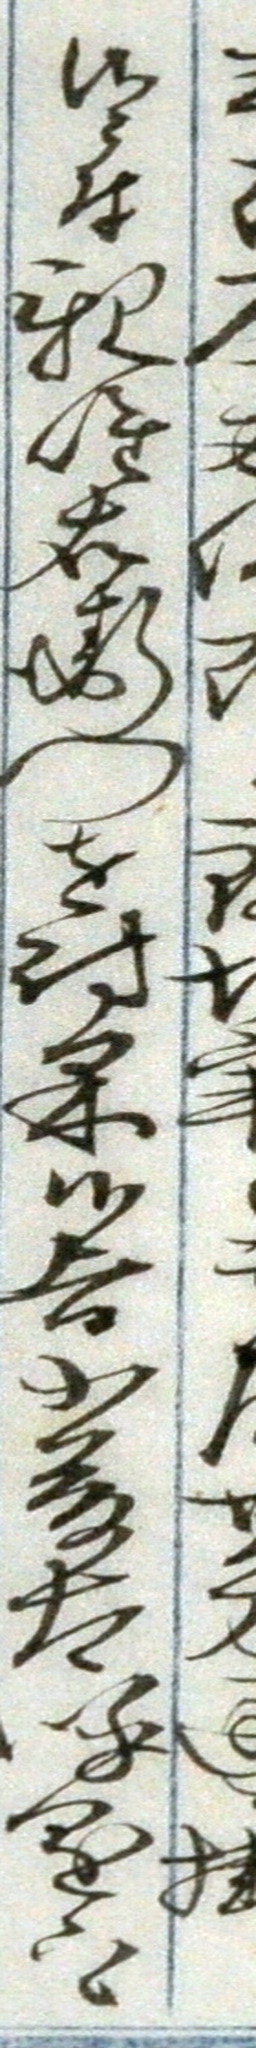候ニ付親唯右衛門を討果候旨小藤太呼懸候ハヽ
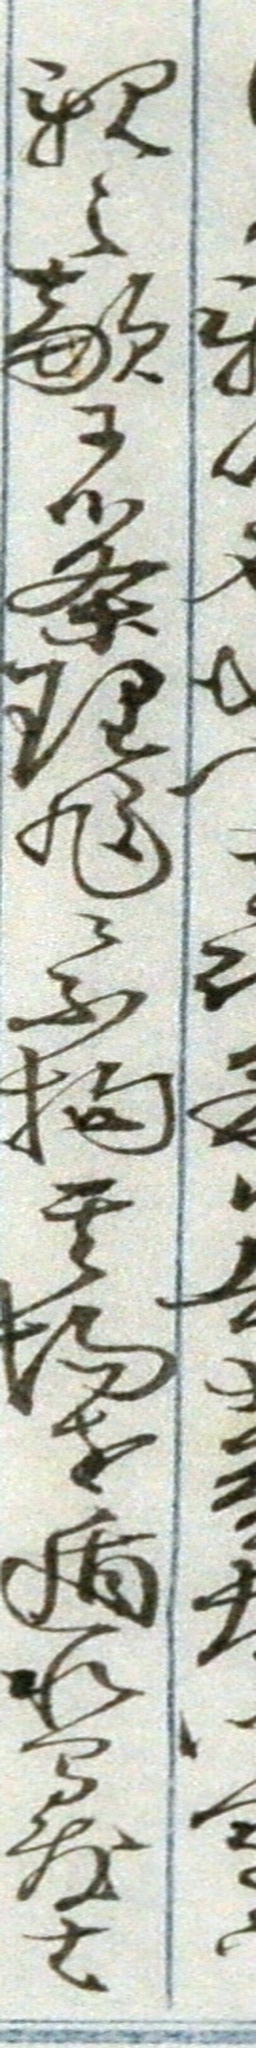親之敵尓候条理非ニ不拘其場を遁れ間敷者
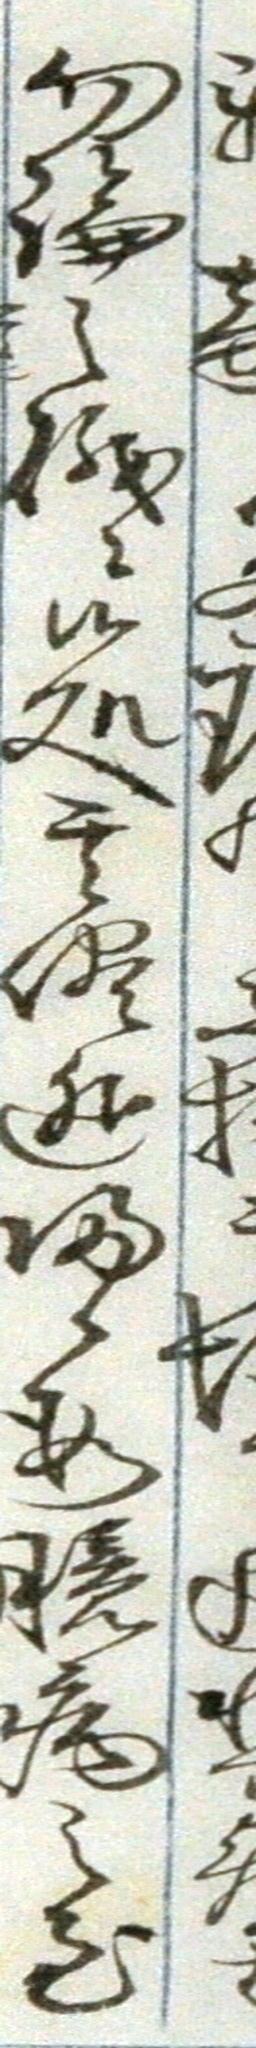勿論之儀ニ候処其儘逃帰候段臆病之至

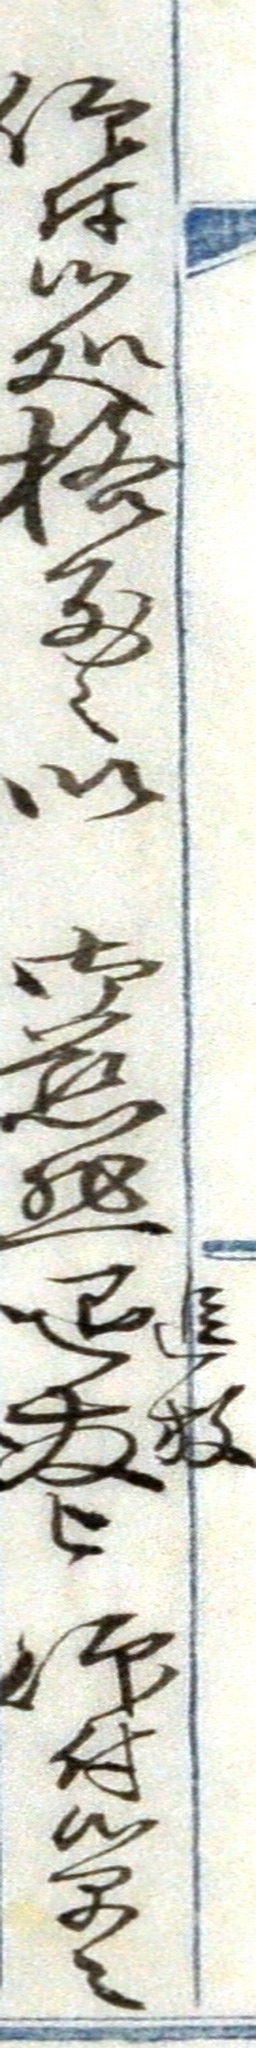仰付候処格別之以御慈悲退散被仰付候早々
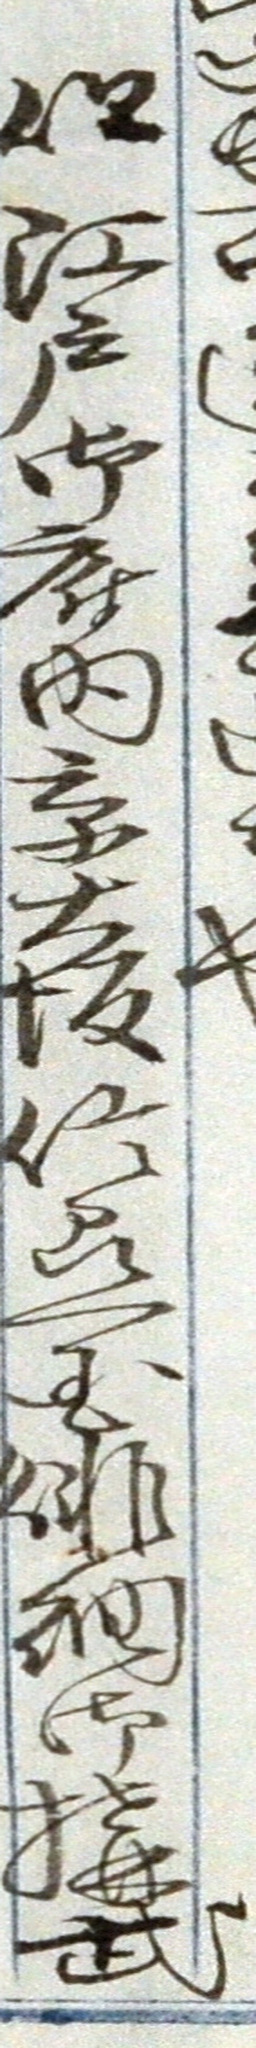但江戸御府内京大坂信州一国徘徊御構武
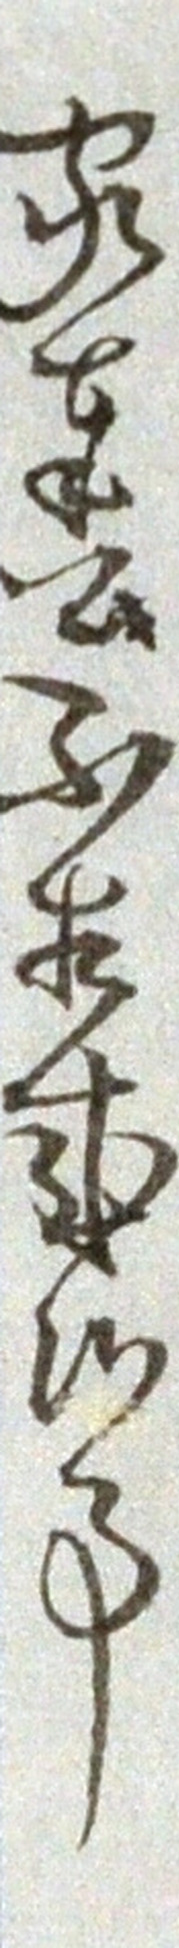家奉公不相成候事
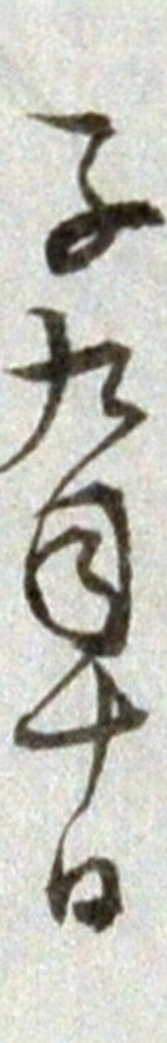子九月十日
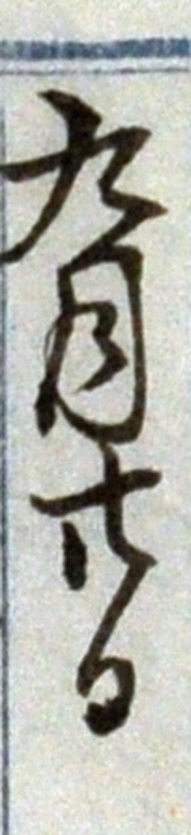九月廿日
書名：川面小藤太子細有之多賀谷唯右衛門ヲ打果候一件
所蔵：伊那市立高遠町図書館・合同会社AMANE
